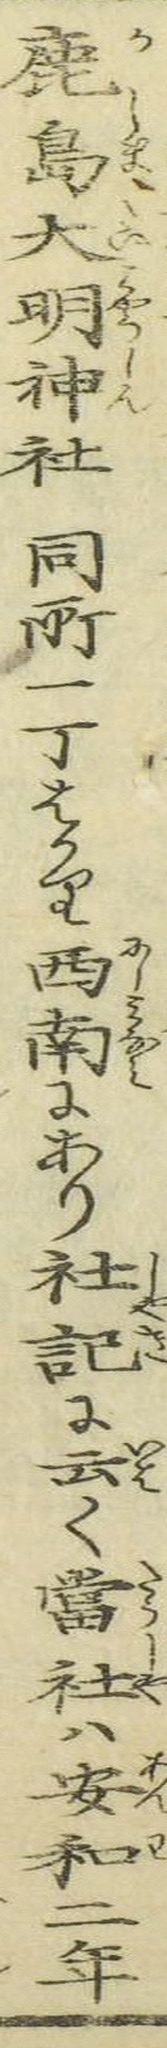鹿島大明神社同所一丁はかり西南にあり社記に云く當社は安和二年
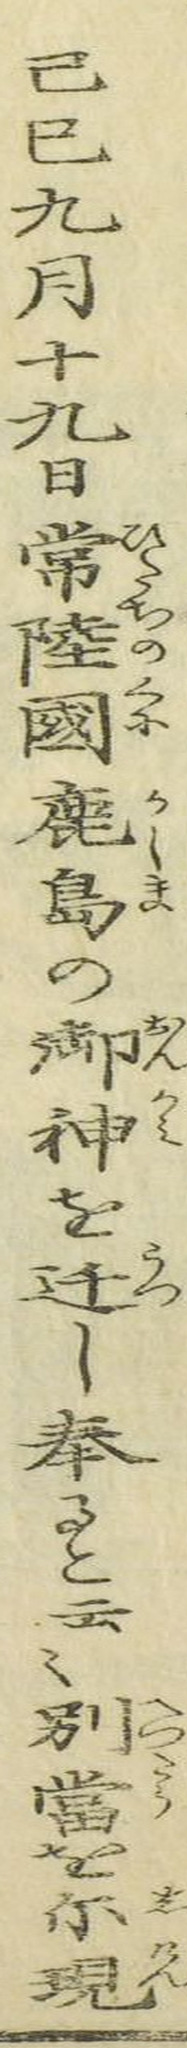己巳九月十九日常陸國鹿島の御神を迁し奉ると云々別當を尓現
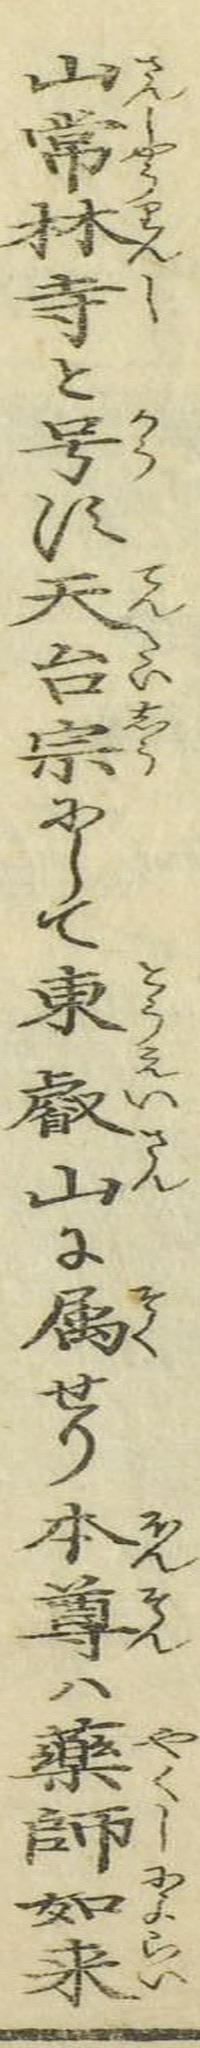山常林寺と号す天台宗にして東叡山に属せり本尊は薬師如来
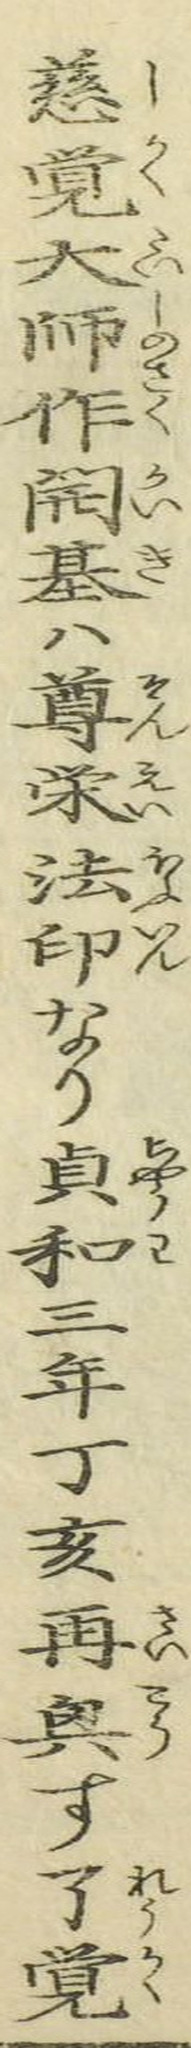慈覚大師作開基は尊栄法印なり貞和三年丁亥再興す了覚
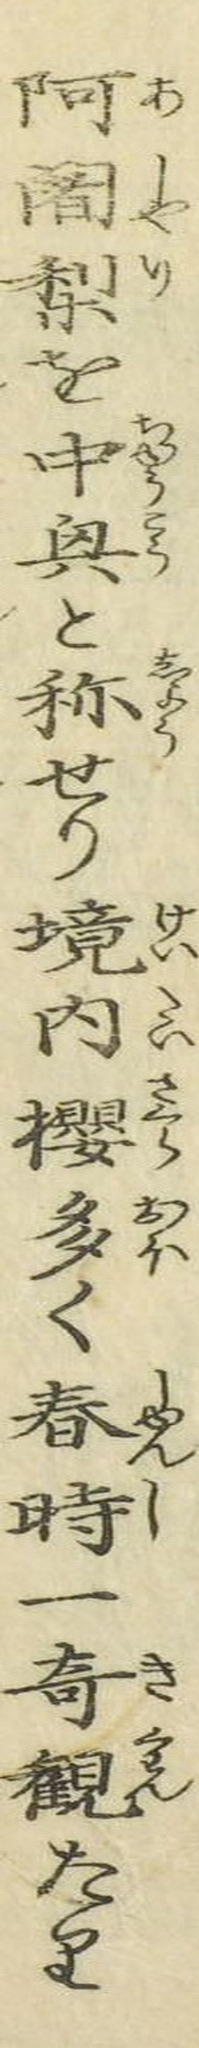阿闍梨を中興と称せり境内櫻多く春時一奇観たり
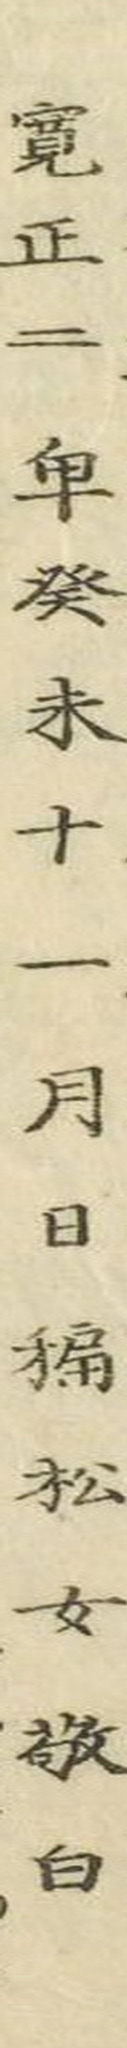寛正二癸未十一月日松女敬白
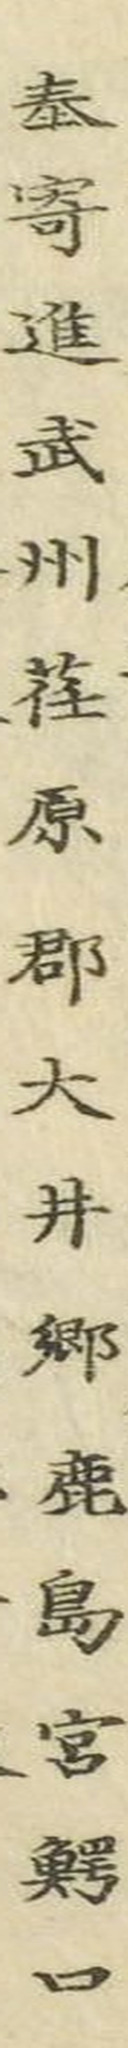奉寄進武州荏原郡大井郷鹿島宮鰐口
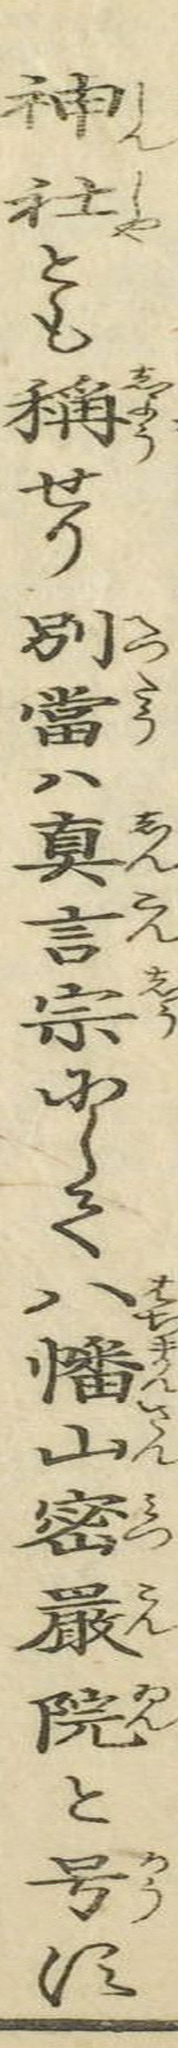神社とも稱せり別當は真言宗にして八幡山密嚴院と号す
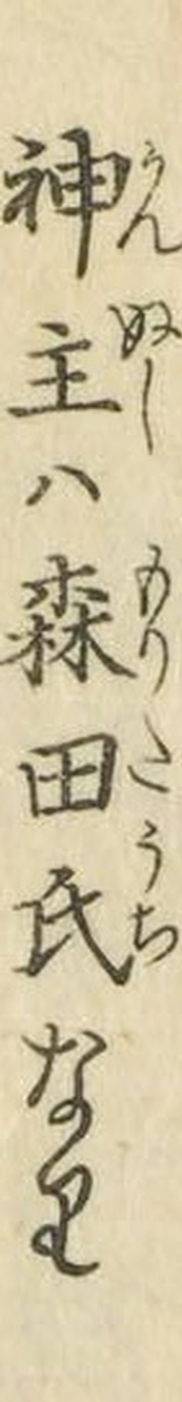神主は森田氏なり
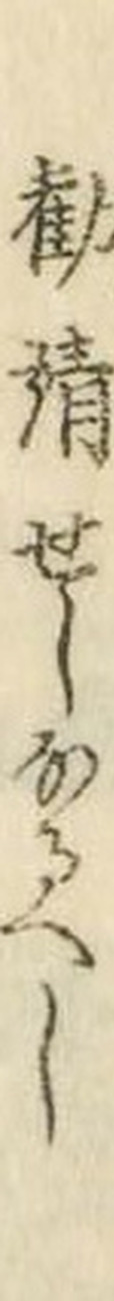勧請せしなるへし
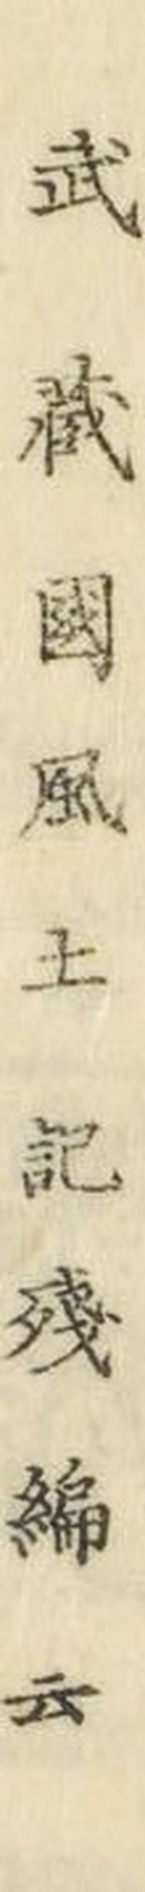武藏國風土記殘編云
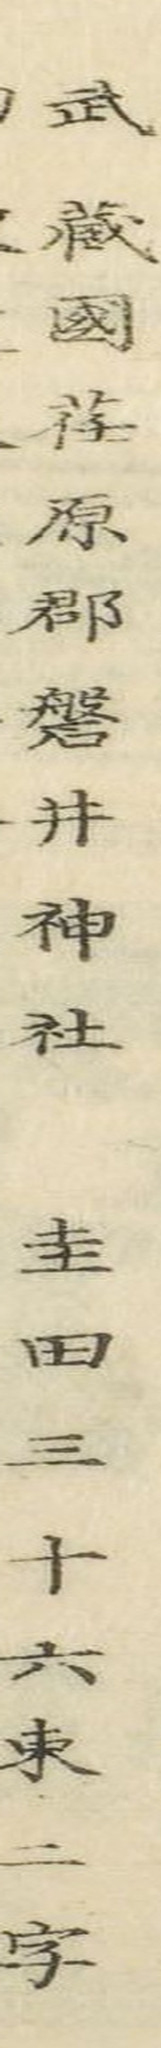武藏國荏原郡磐井神社圭田三十六束二字
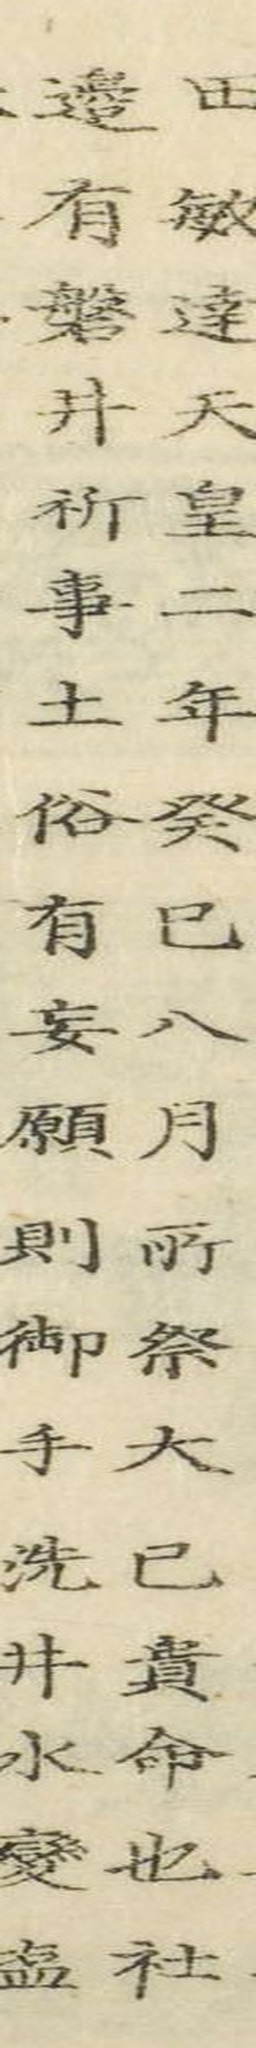邊有磐井祈事土俗有妄願則御手洗井水變塩
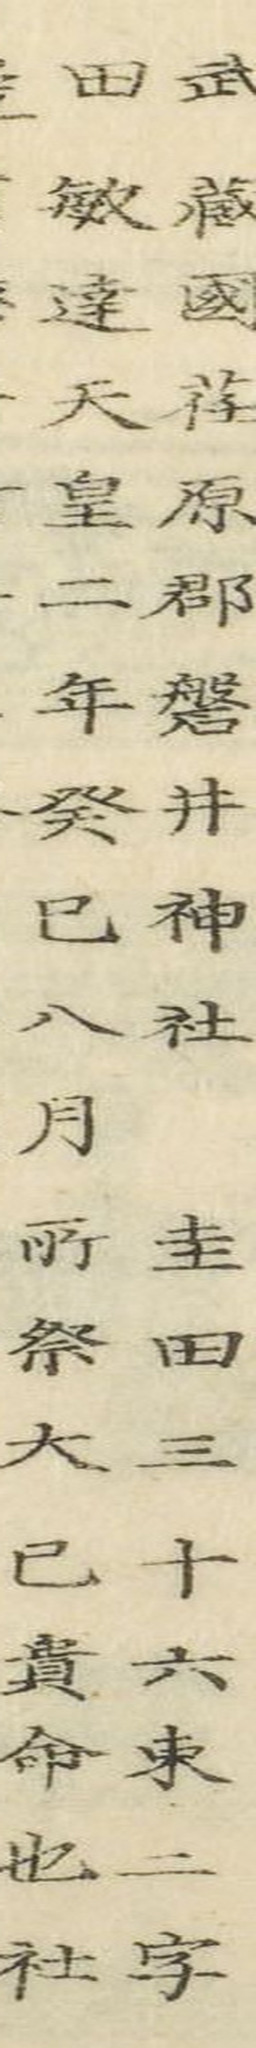田敏達天皇二年癸巳八月所祭大己貴命也社
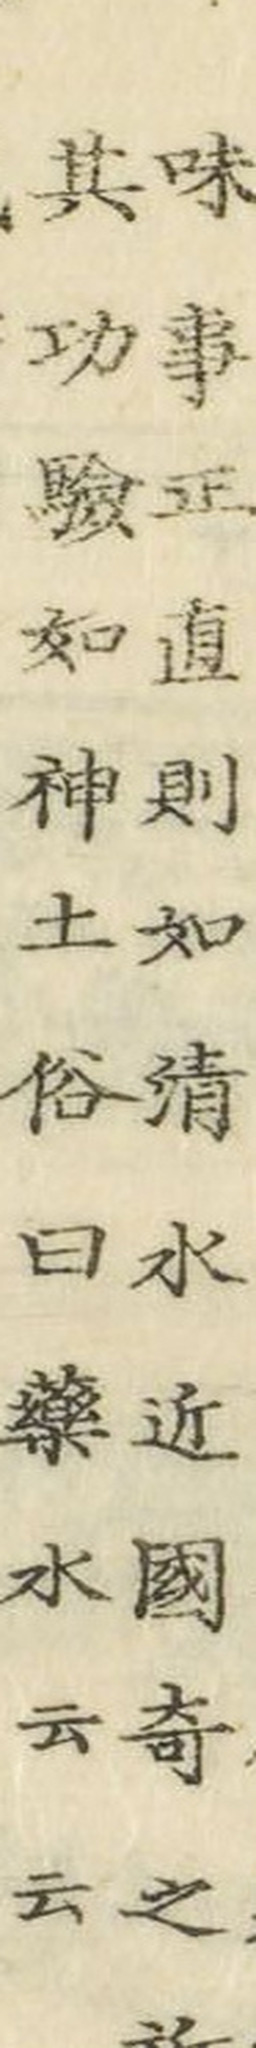其功驗如神土俗曰藥水云云
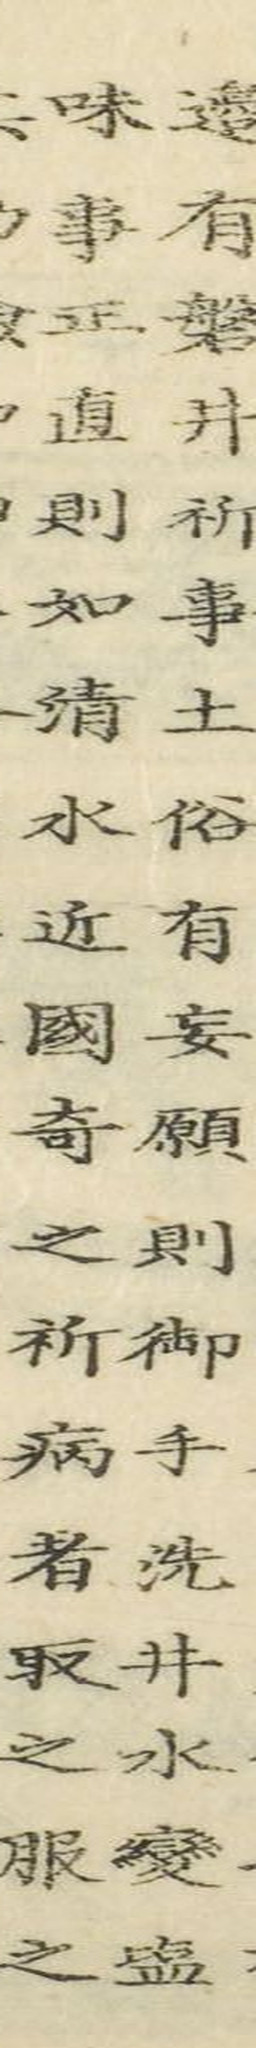味事正直則如清水近國奇之祈病者取之服之
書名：江戸名所図会 20巻 巻之4
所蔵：東京学芸大学教育コンテンツアーカイブ
